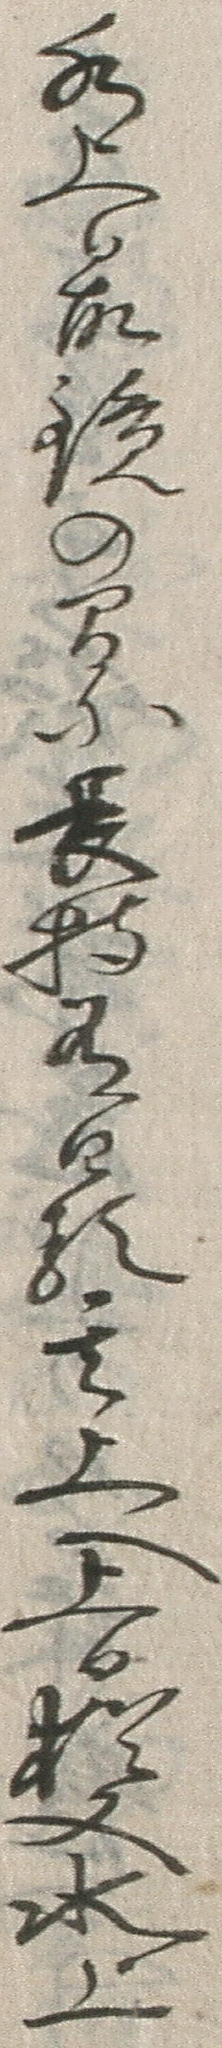水上る故鏡の間に長持有ける其上へ上る猶又水上
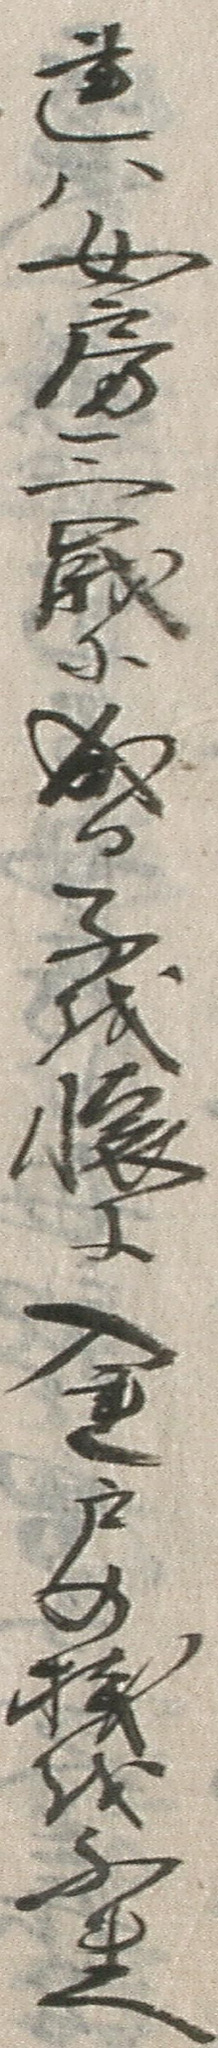れは女房三歳に成る子を懐に入れ戸の桟をふまへ
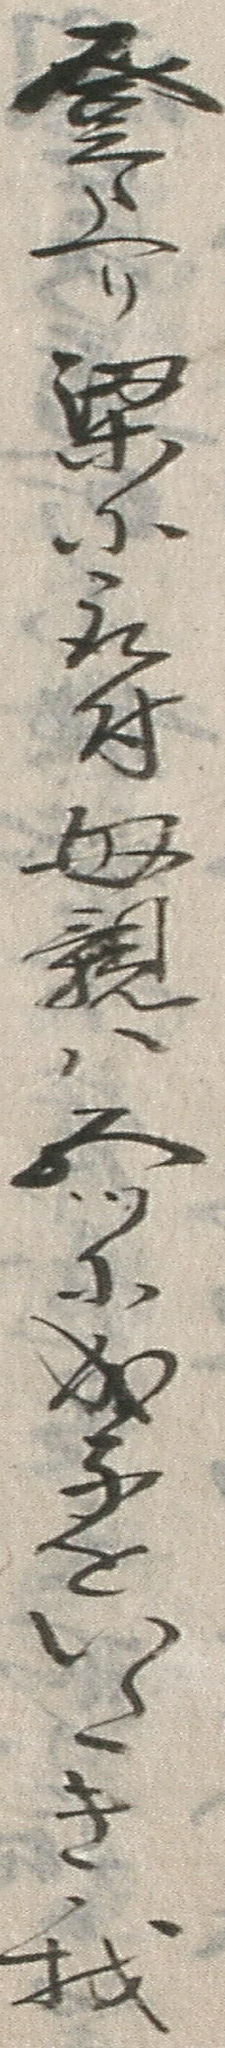登上り梁に取付母親は五ツに成子をいたき我
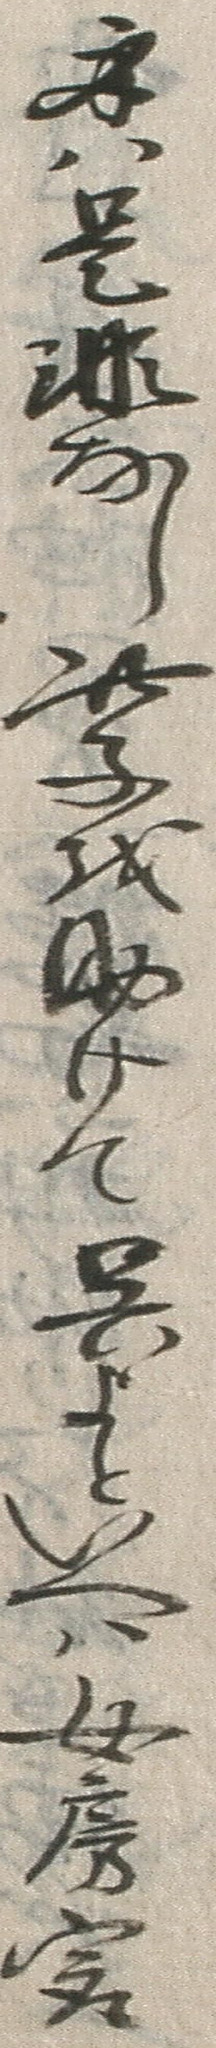身は是非なし此子を助けて呉よといへは女房最
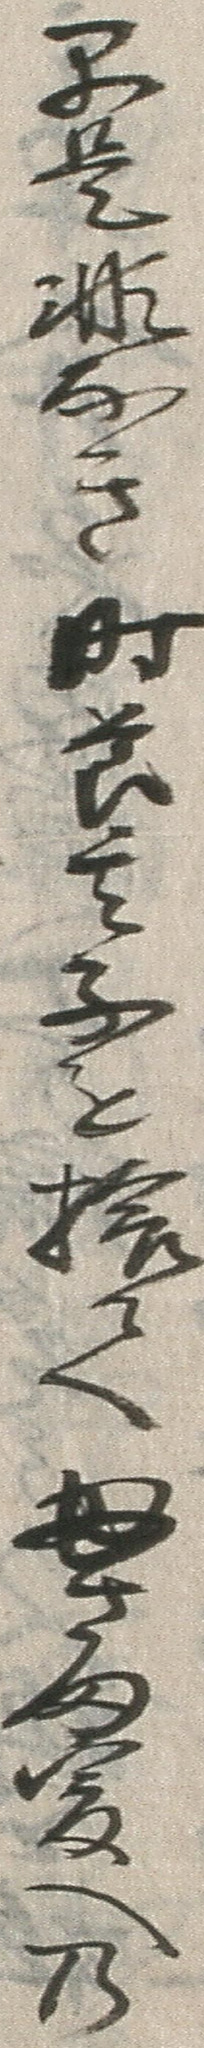早是非なき時節其子を捨て母さま爰への
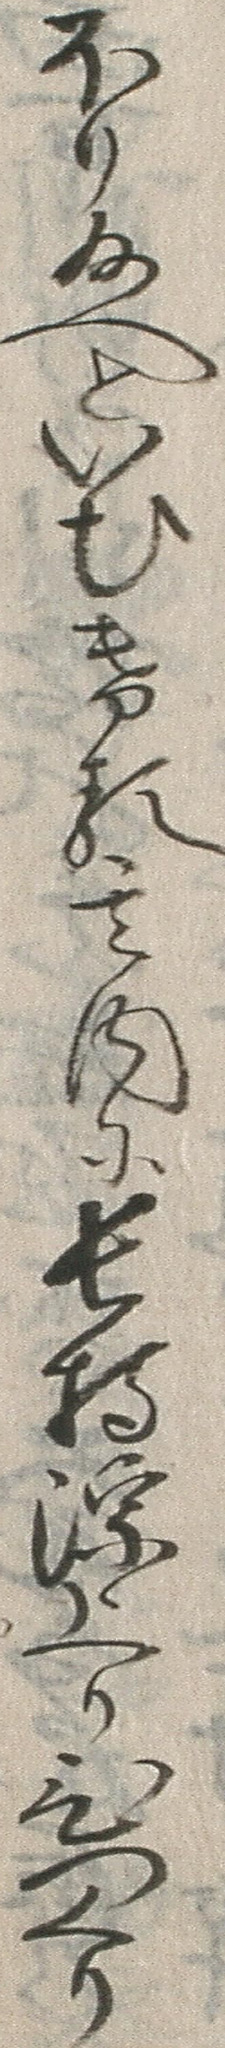ほり給へといひける其内に長持浮上りひつくり
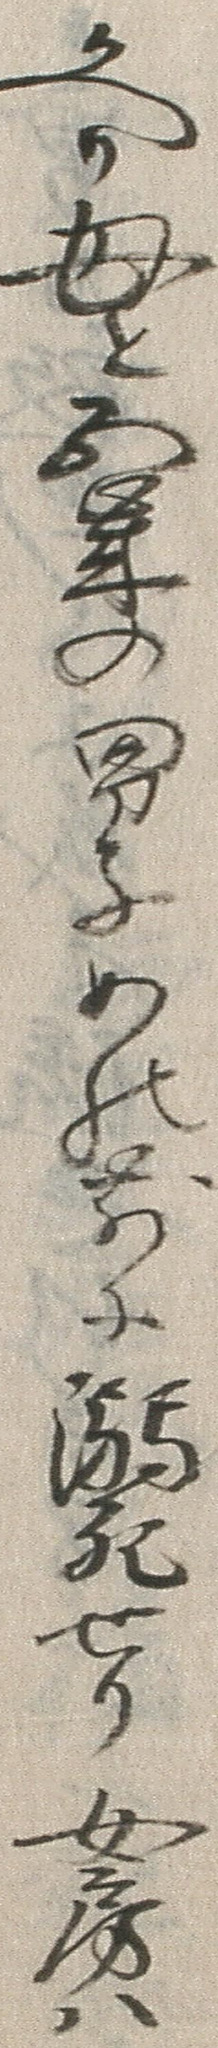かへり母と五歳の男子めの前に溺死せり女房は
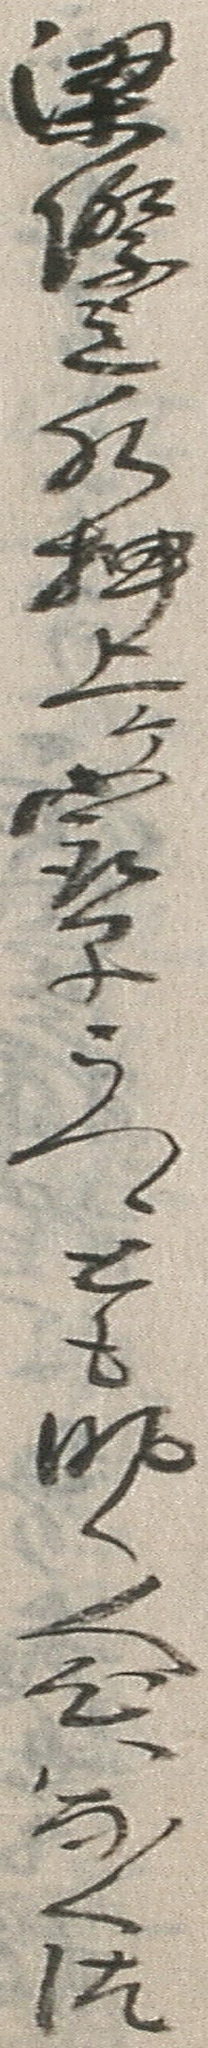梁際迄水押上ケ最早うつゝとも助く人心はなくつ
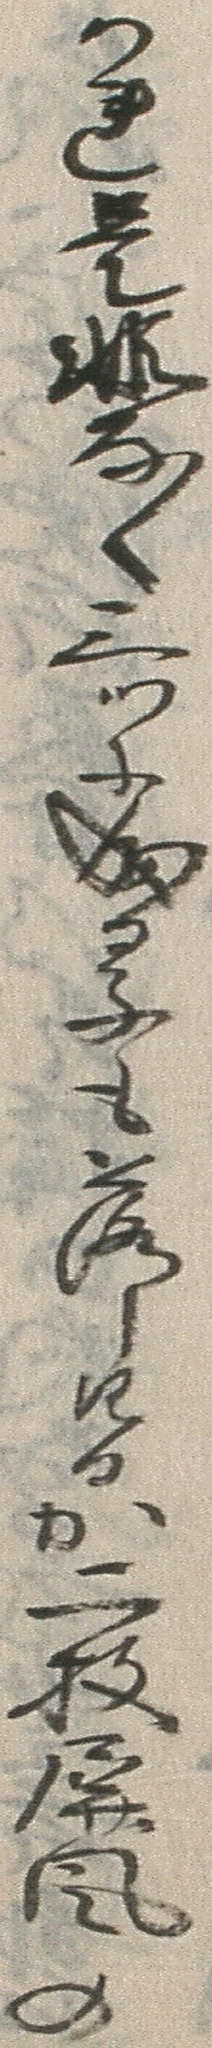かれ是非なく三ツに成る子も落しけるか二枚屏風の
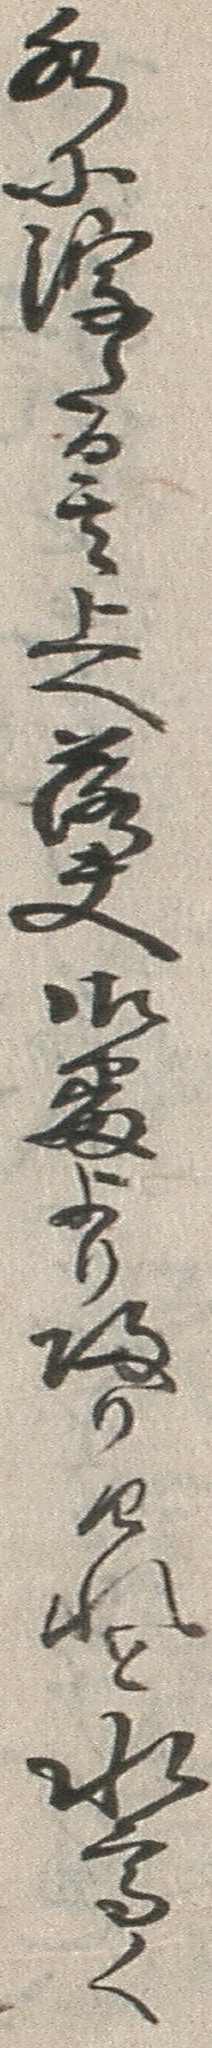水に浮たる其上へ落夫御番より帰りけれと水高く
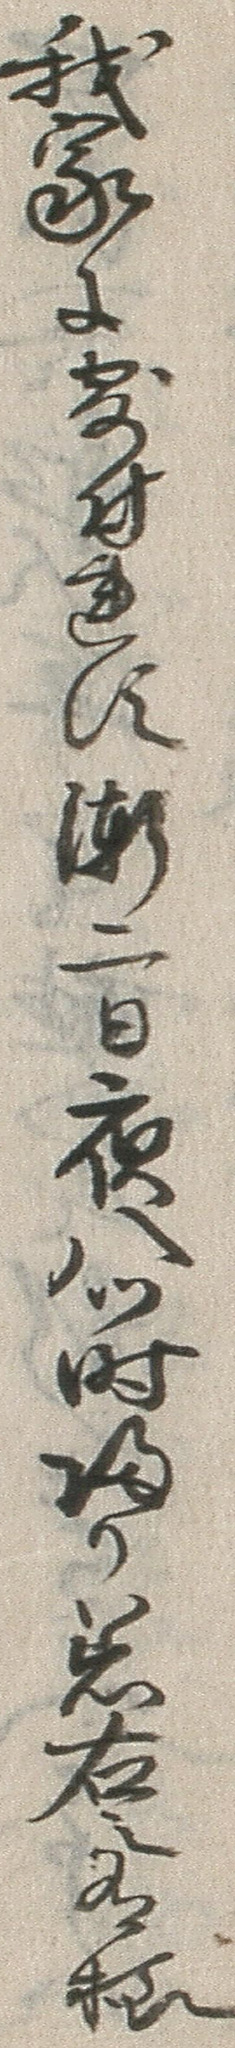我家に寄付れす漸二日夜八ツ時帰り着右之有様
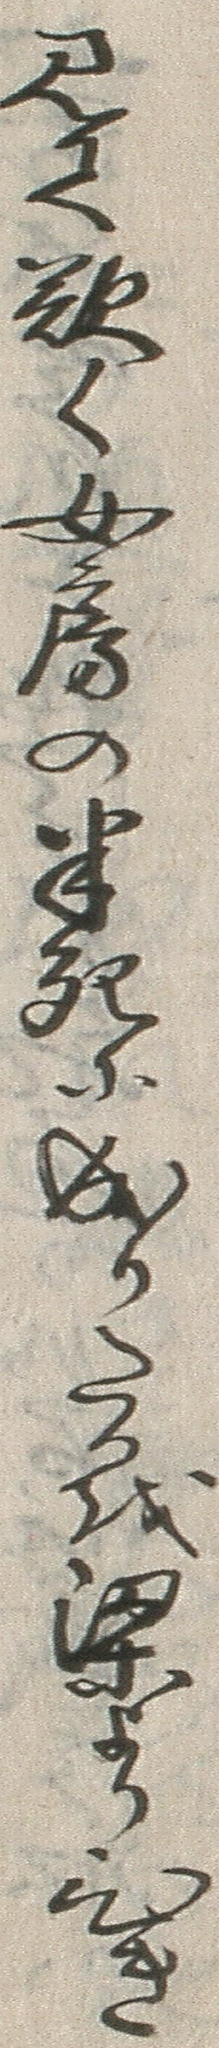見て嘆く女房の半死に成りたるを梁よりひき
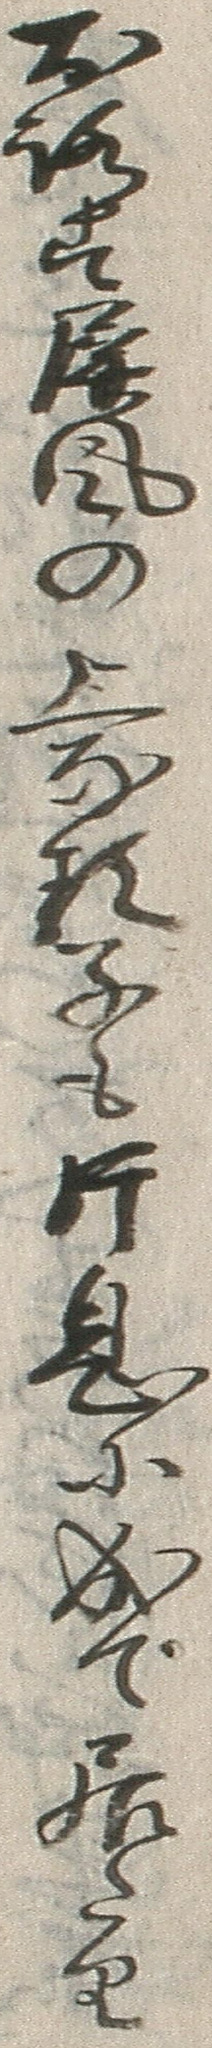おろす屏風の上なる子も片息に成て居たり
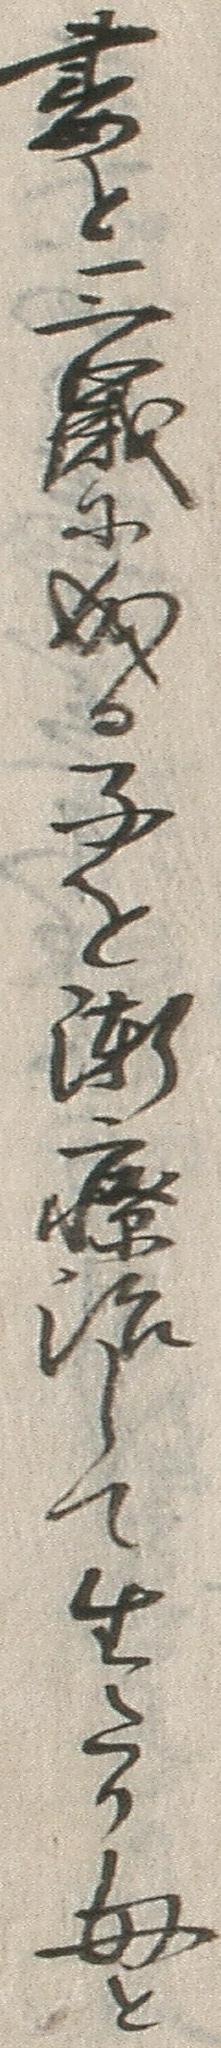妻と三歳に成る子を漸療治して生たり母と
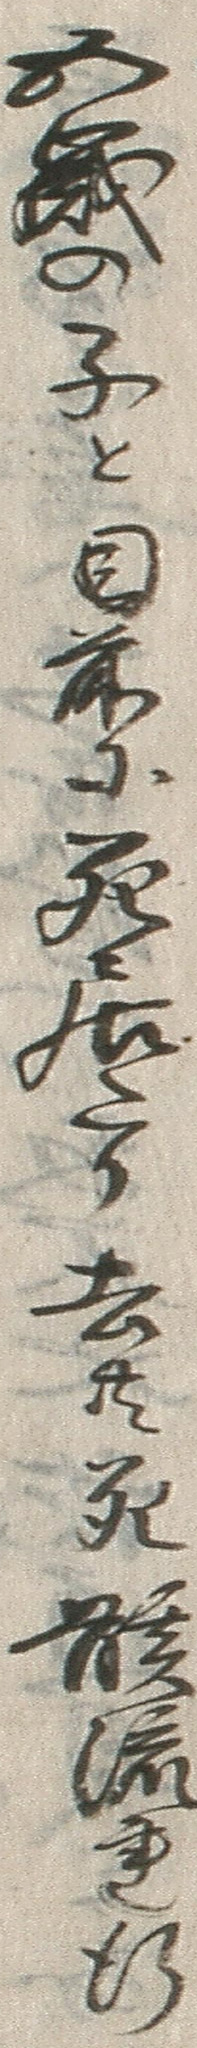五歳の子と目前に死居たり去共死骸流れ行
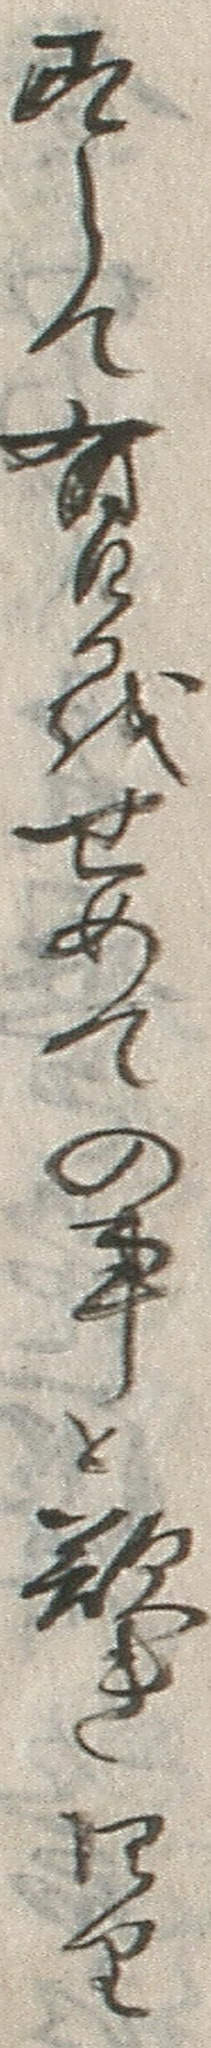すして有けるをせめての事と嘆きけり
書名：享保十三年江戸洪水記
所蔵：東京大学地震研究所図書室 Earthquake Research Institute Library, The University of Tokyo, JAPAN
